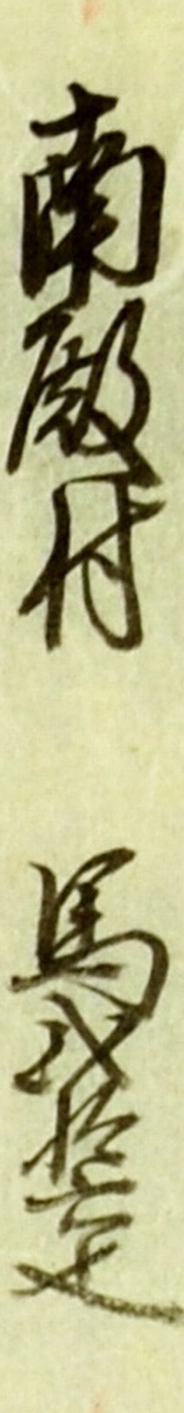向方村馬拾六疋
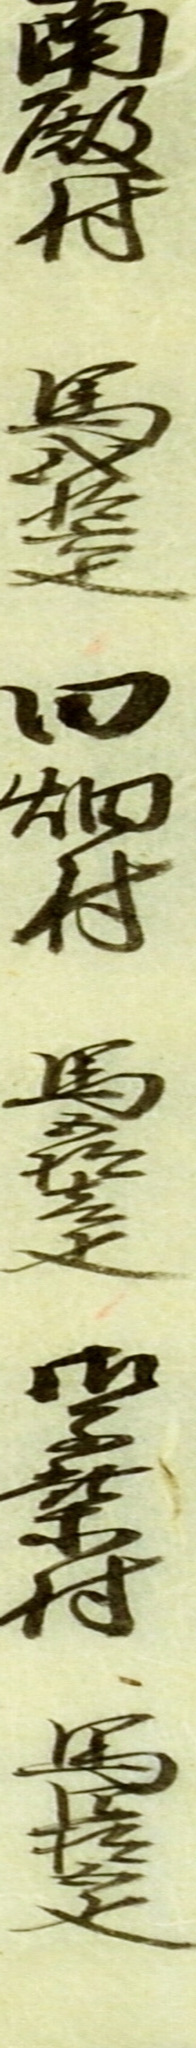南殿村馬弐拾六疋日畑村馬五拾壱疋御子柴村馬四拾五疋
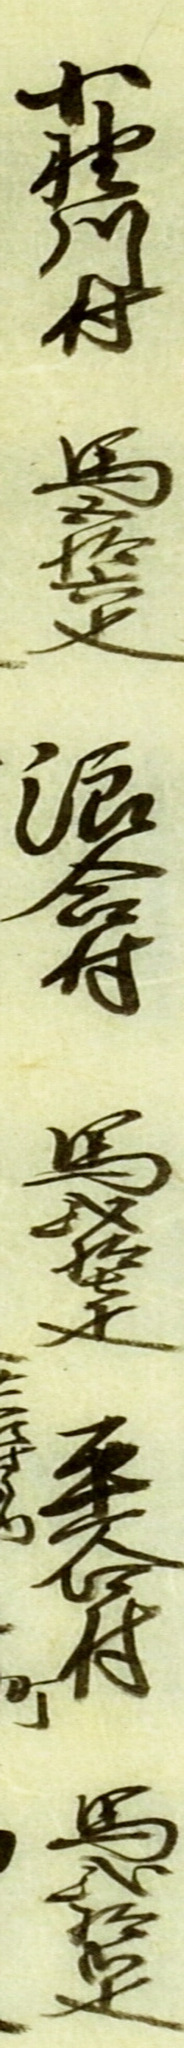小野川村馬五拾六疋浪合村馬弐拾七疋平谷村馬弐拾弐疋
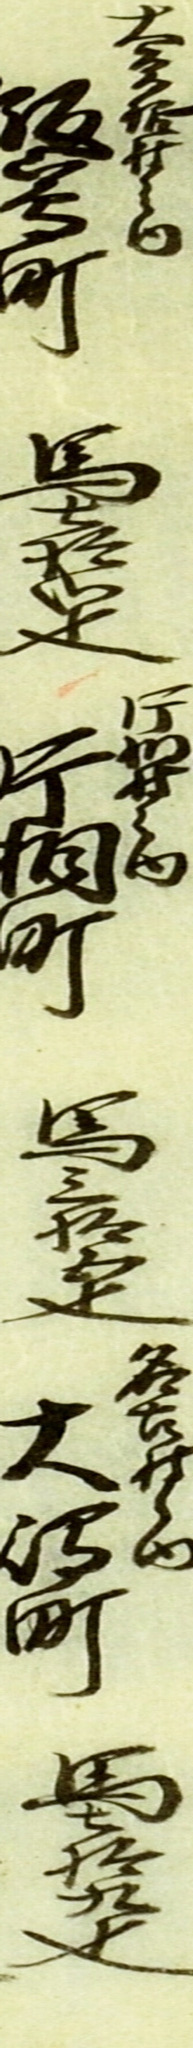飯嶌町馬七拾弐疋片桐町馬三拾五疋大嶋町馬七拾九疋
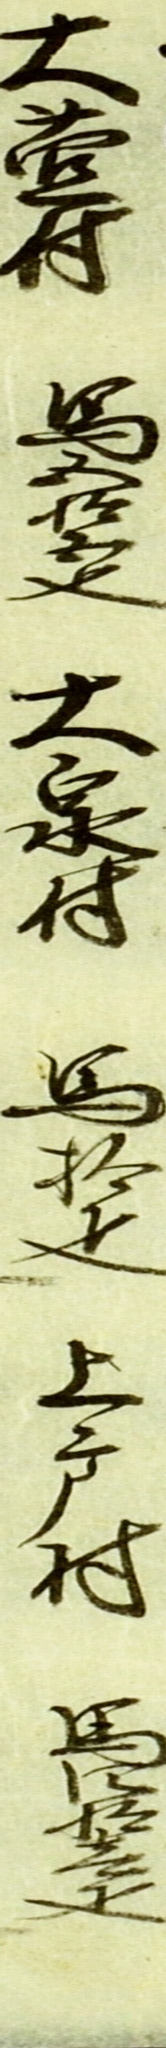大萱村馬五拾五疋大泉村馬拾疋上戸村馬四拾壱疋
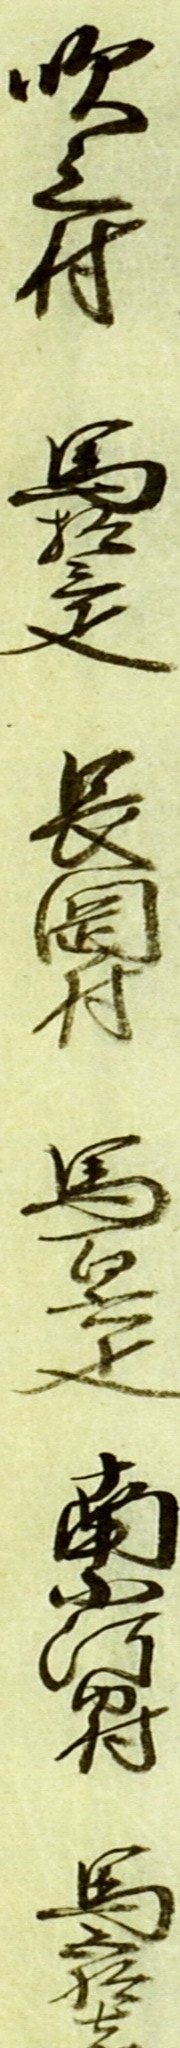吹上村馬拾三疋長岡村馬百六疋南小河内村馬五拾七疋
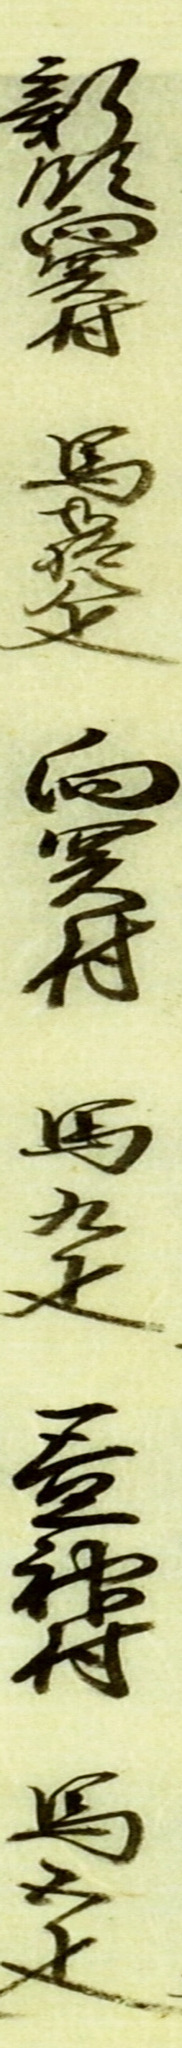新領向関村馬弐拾八疋向関村馬九疋昼神村馬五疋
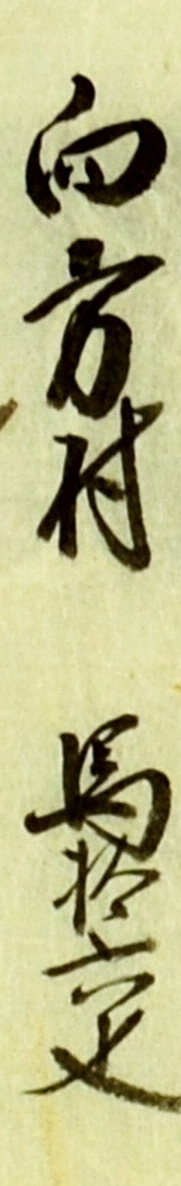向方村馬拾六疋
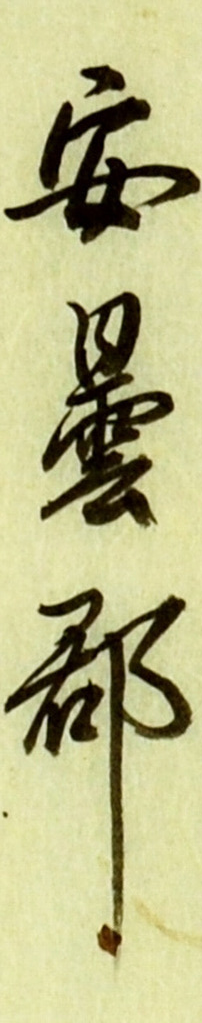安曇郡

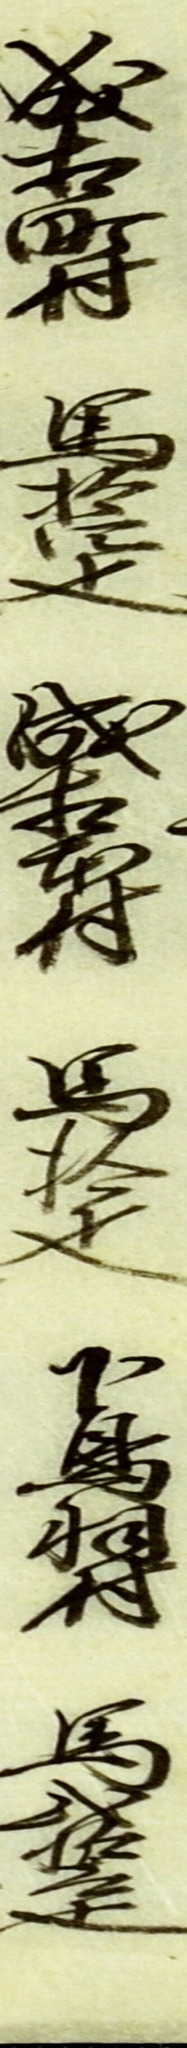成相町村馬拾四疋成相本村馬拾疋下島羽村馬弐拾壱疋
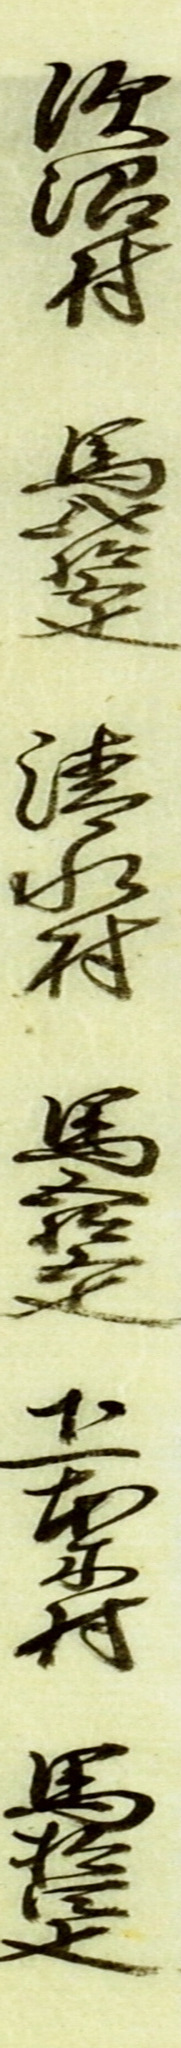須沼村馬弐拾五疋清水村馬五拾五疋下一本木村馬拾四疋
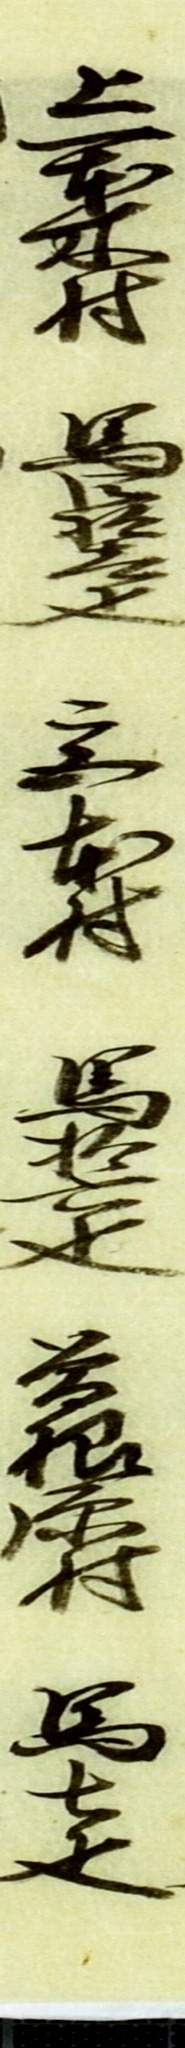上一本木村馬四拾壱疋宮本村馬拾六疋曾根原村馬七疋

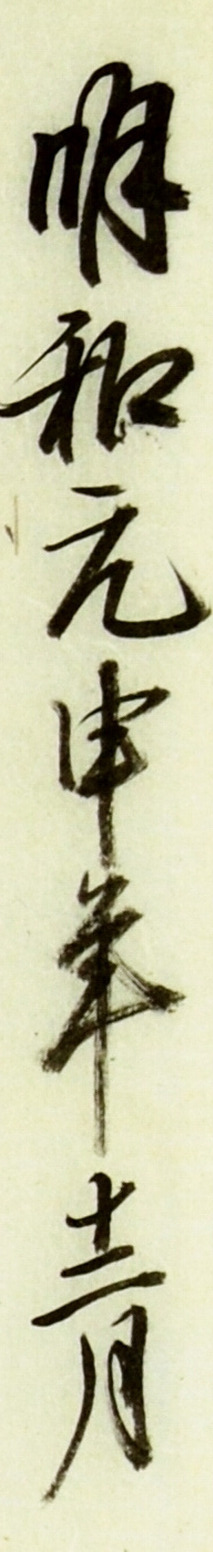明和元申年十二月
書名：中馬荷物并口銭中馬稼之村名馬数等申渡書
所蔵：伊那市立高遠町図書館・合同会社AMANE
